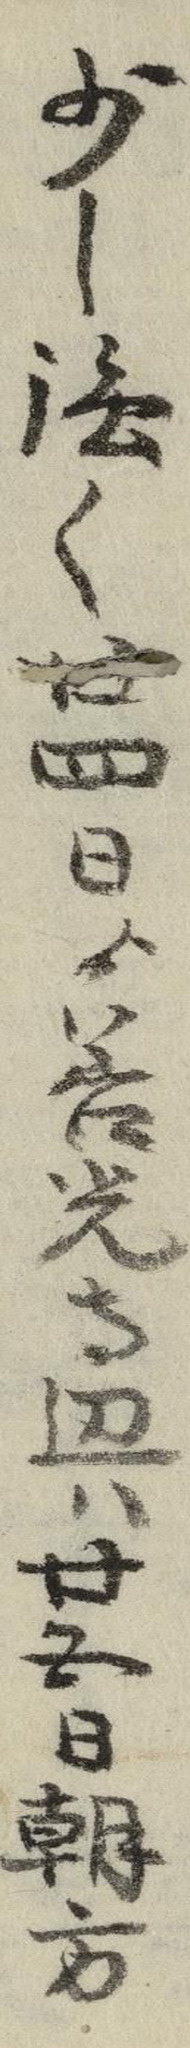少し強く廿四日ゟ善光寺辺ハ廿五日朝方
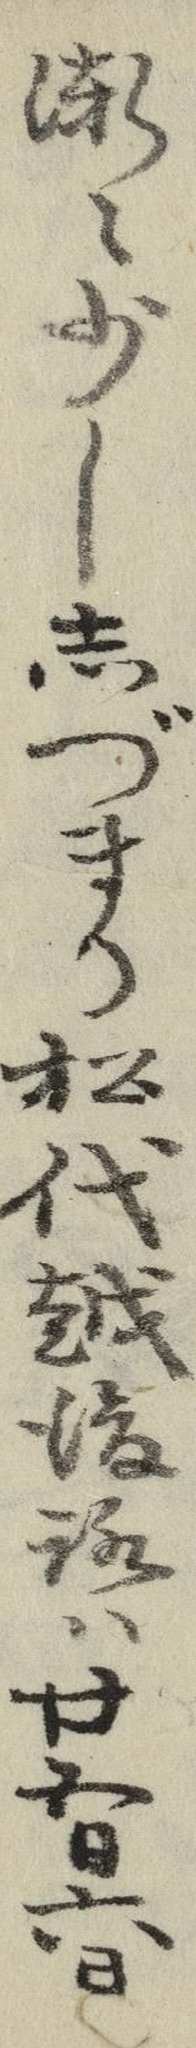漸々少ししづまり松代越後路ハ廿五日六日
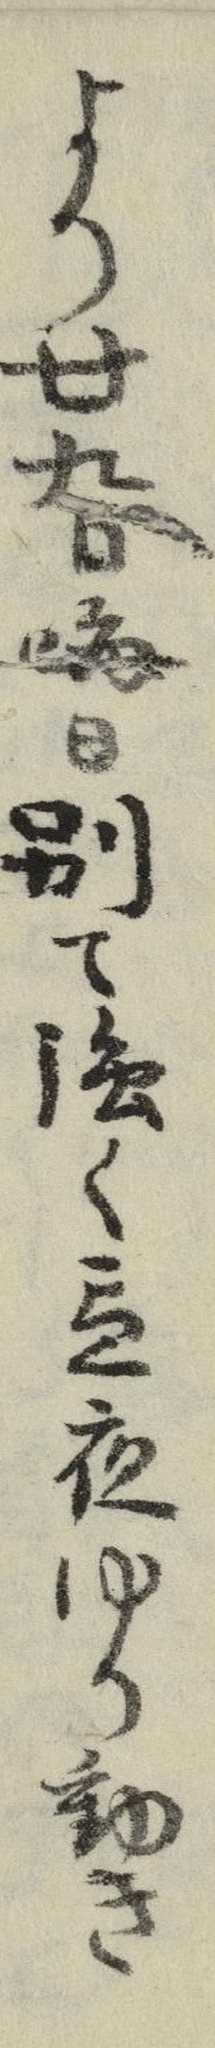より廿九日晦日別て強く昼夜ゆり動き
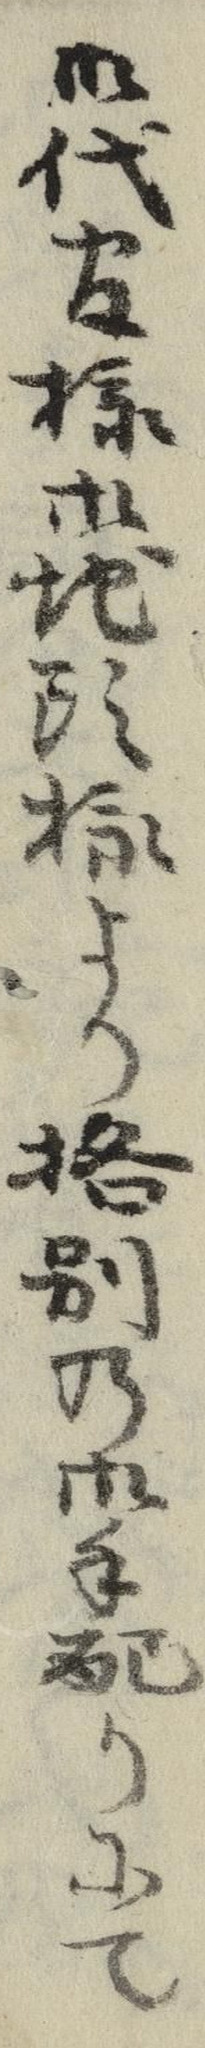御代官様御地頭様より格別の御手配りにて
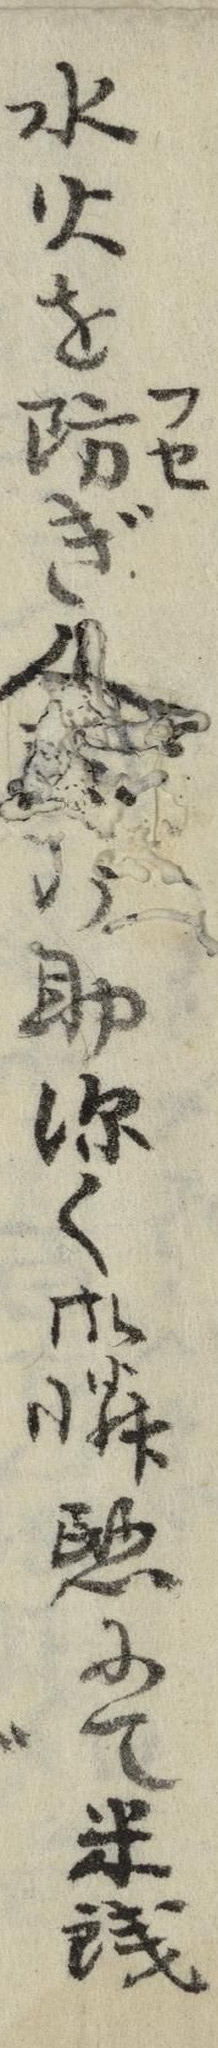水火を防ぎ人助深く御憐憫にて米銭
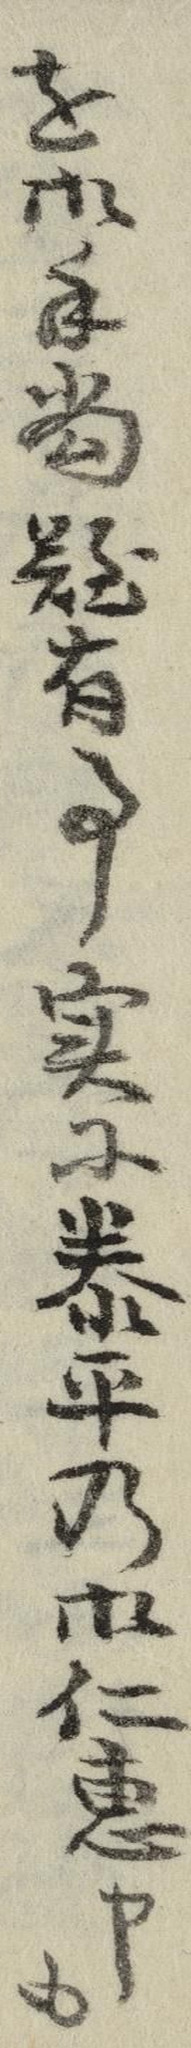を御手当難有事実に泰平の御仁恵申も
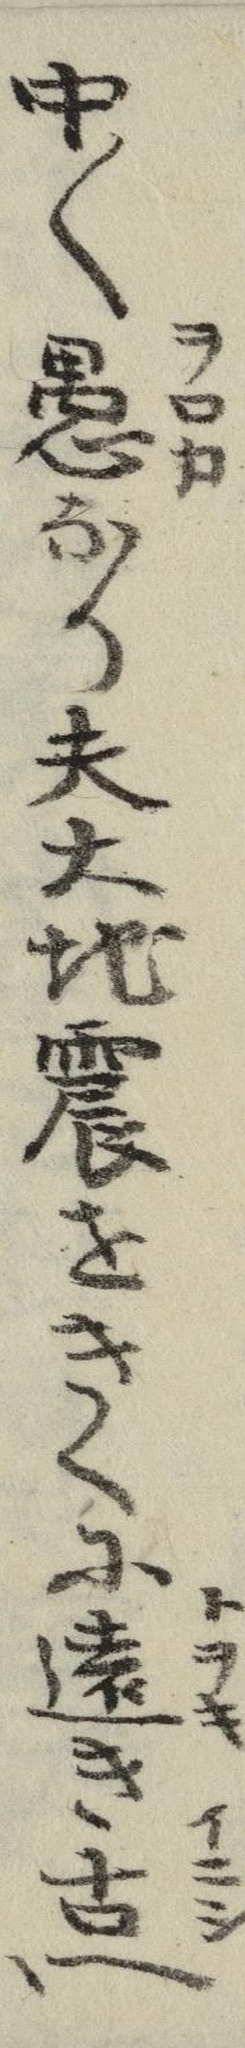中〳〵愚なり夫大地震をきくに遠き古へハ
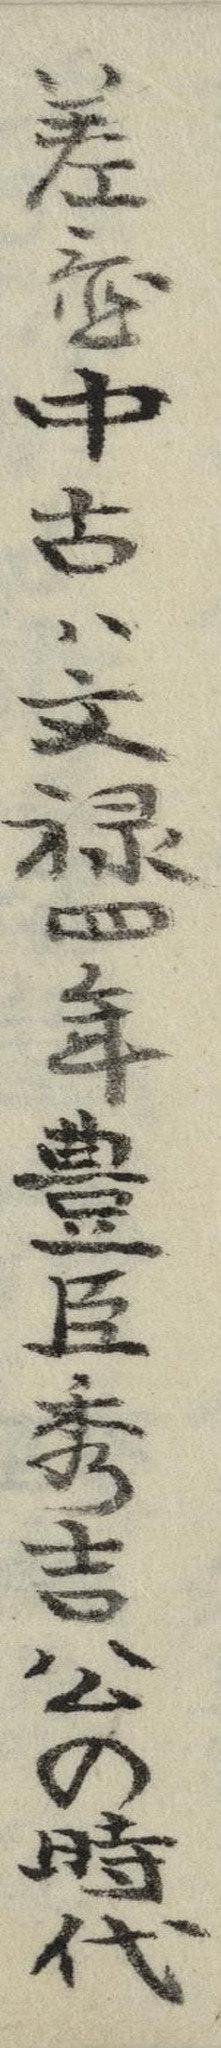差置中古ハ文禄四年豊臣秀吉公の時代
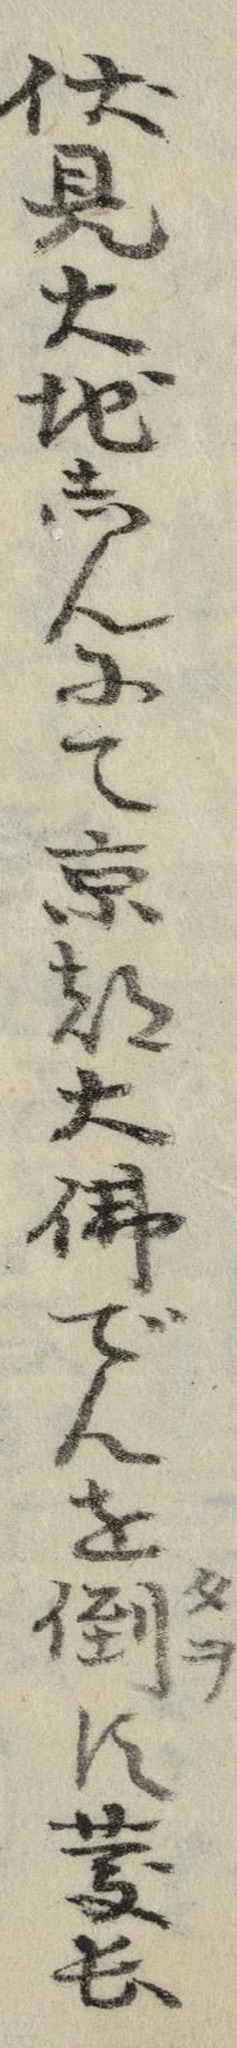伏見大地しんにて京都大仏でんを倒す慶長
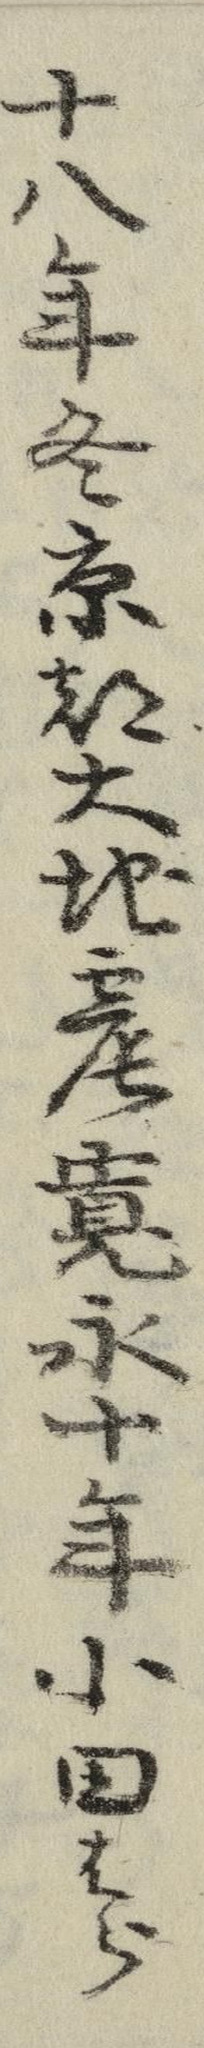十八年冬京都大地震寛永十年小田はら
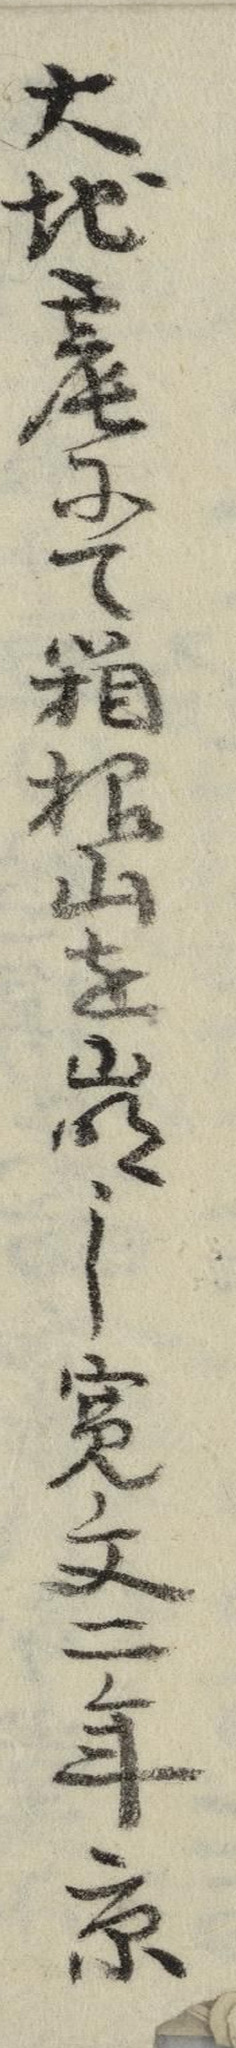大地震にて箱根山を崩し寛文二年京
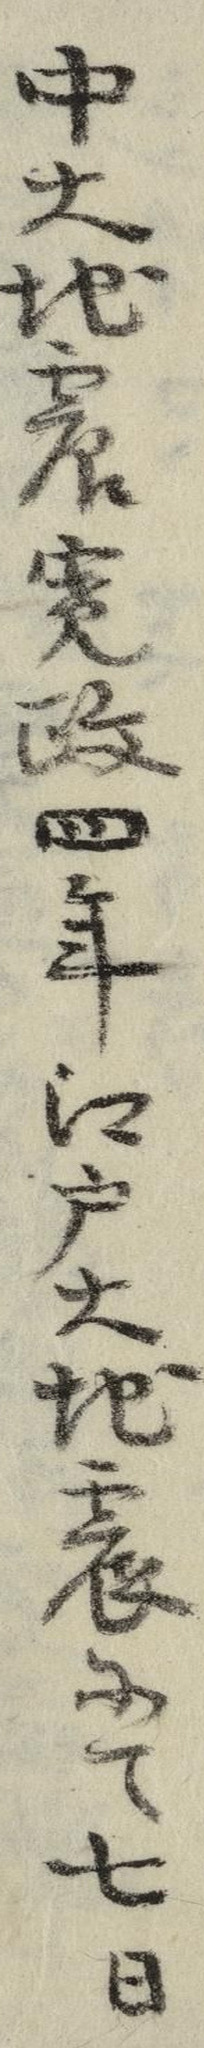中大地震寛政四年江戸大地震にて七日
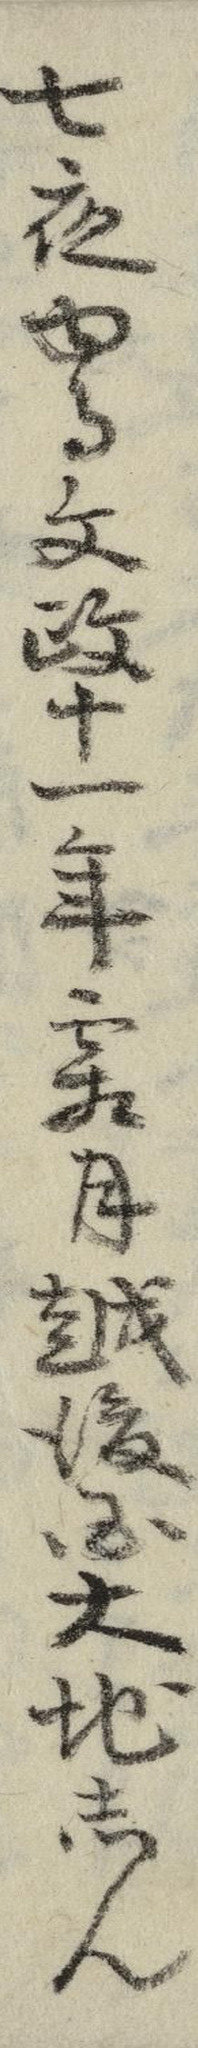七夜ゆる文政十一年霜月越後国大地しん
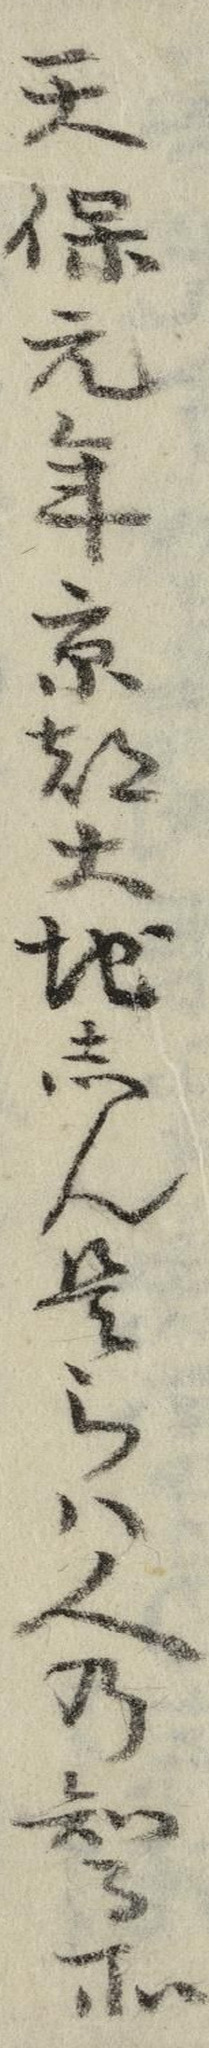天保元年京都大地しん是らハ人の知る所
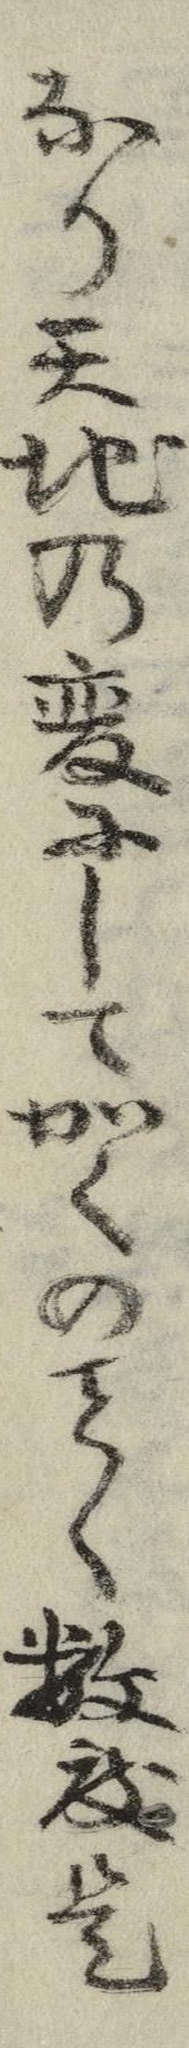なり天地の変にしてかくのことく数度是
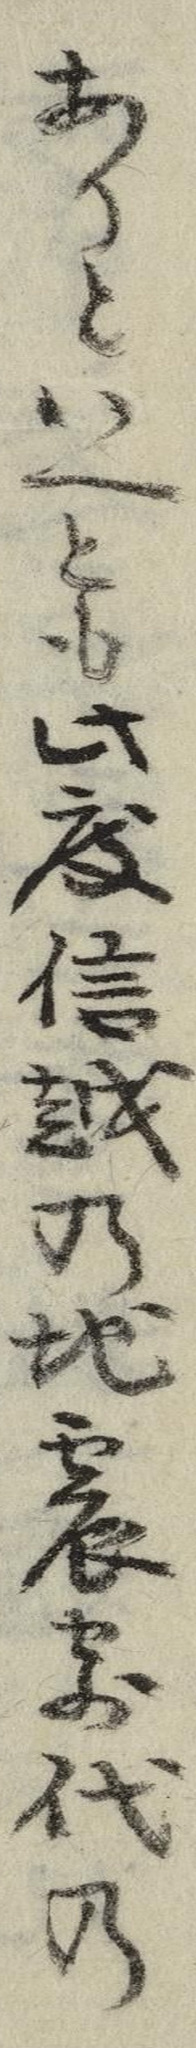ありといへとも此度信越の大地震寄代の
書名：信州大地震一件之冩　丁未弘化四年三月吉日
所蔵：東京大学地震研究所図書室 Earthquake Research Institute Library, The University of Tokyo, JAPAN
